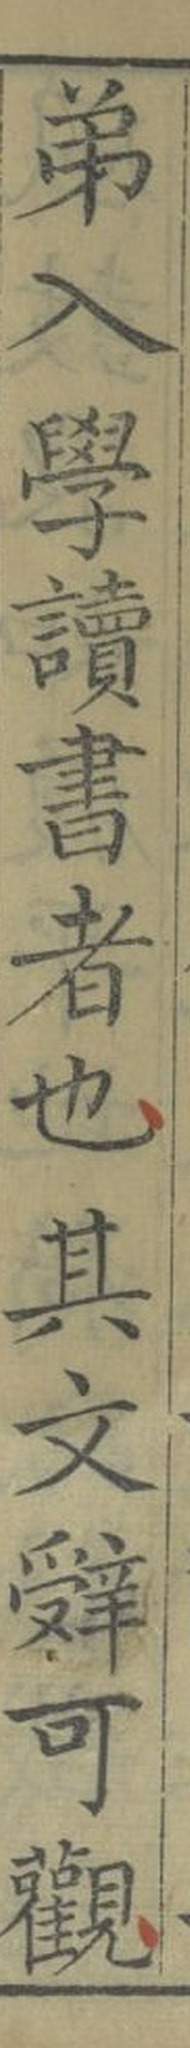弟入學讀書者也其文辤可觀
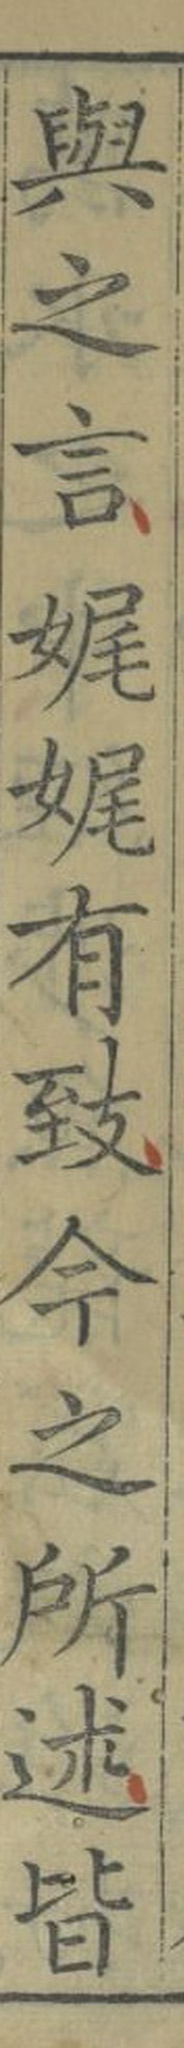與之言娓娓有致今之所述皆
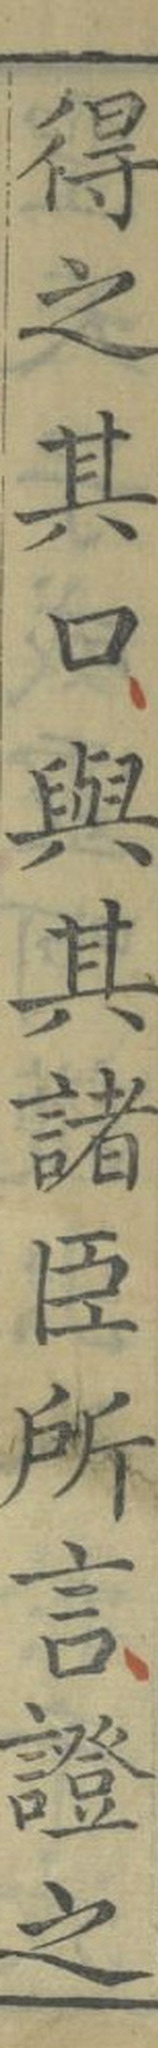得之其口與其諸臣所言證之
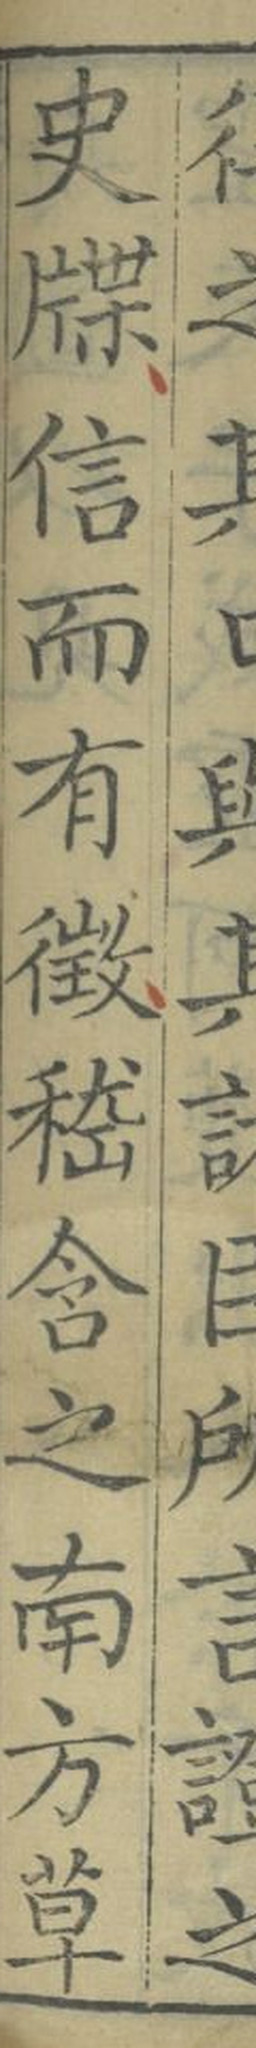史牒信而有徴嵇含之南方草
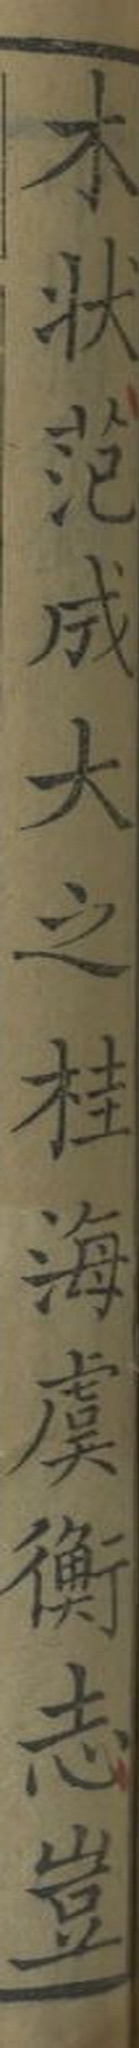木状范成大之桂海虞衡志豈
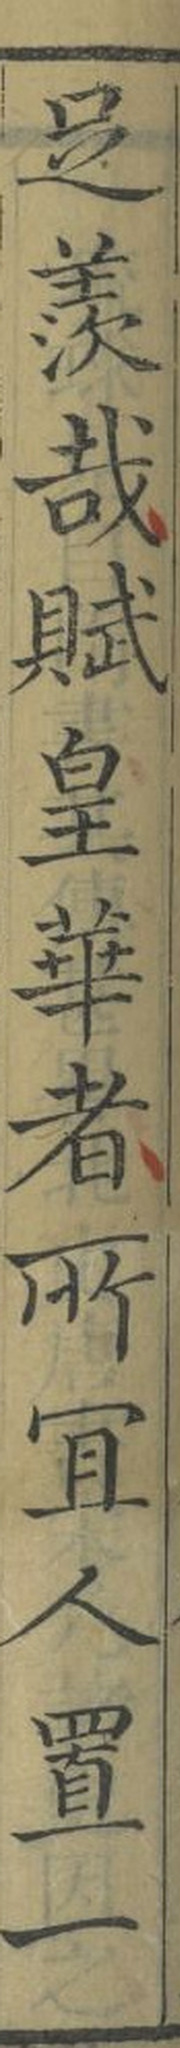足羡哉賦皇華者所冝人置一
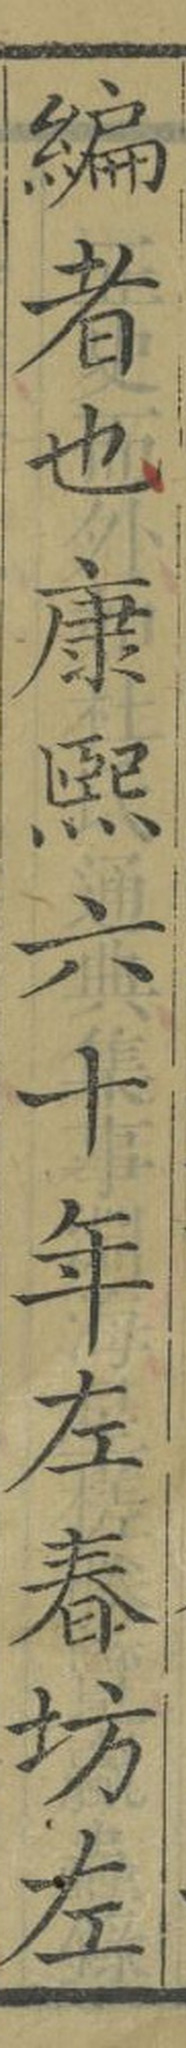編者也康熙六十年左春坊左
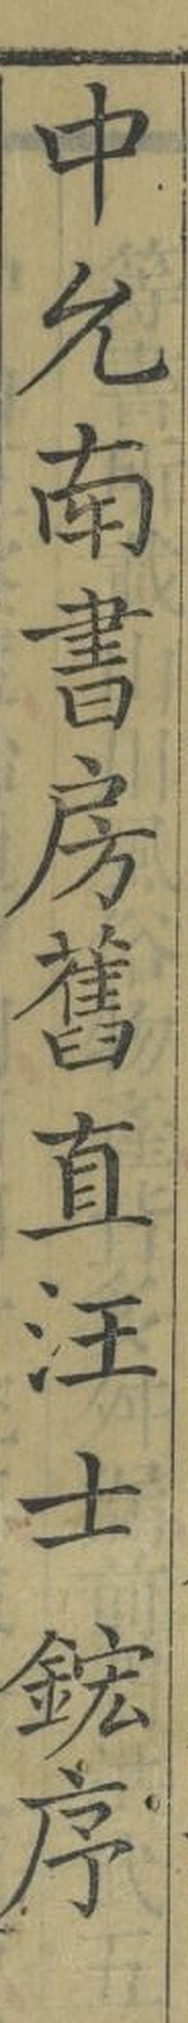中允南書房舊直汪士鋐序

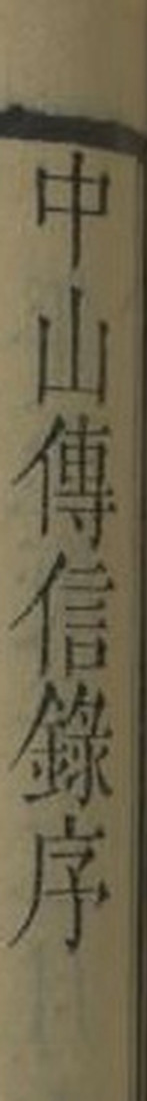中山傳信錄序
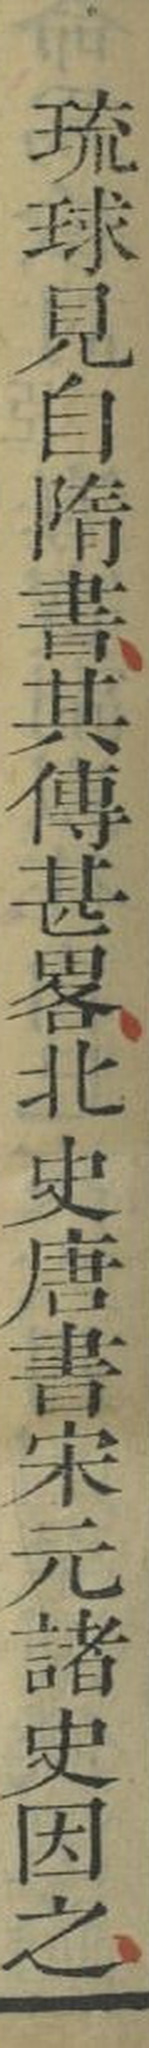琉球見自隋書其傳甚畧北史唐書宋元諸史因之
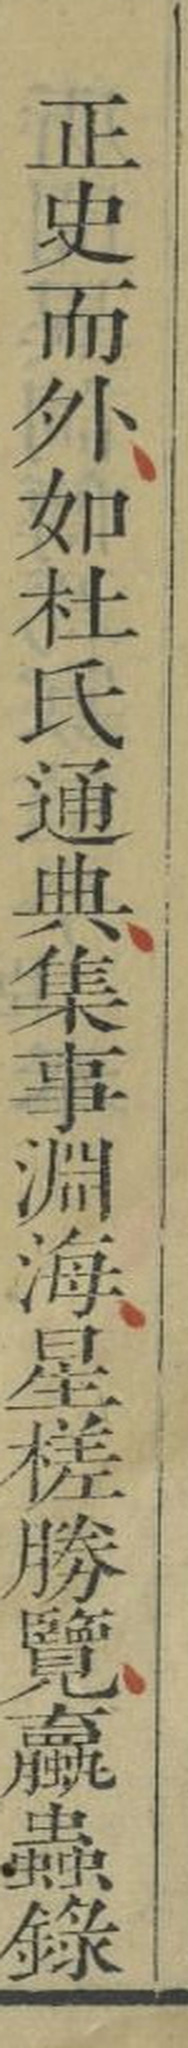正史而外如杜氏通典集事淵海星槎勝覽蠃蟲錄
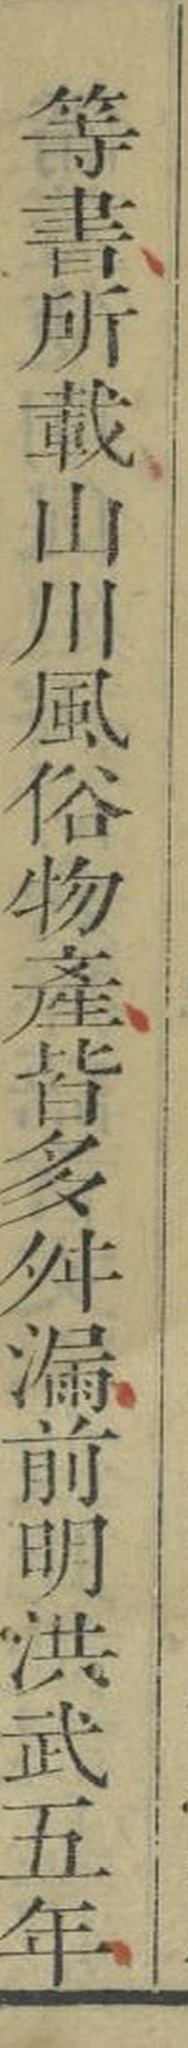等書所載山川風俗物產皆多舛漏前明洪武五年
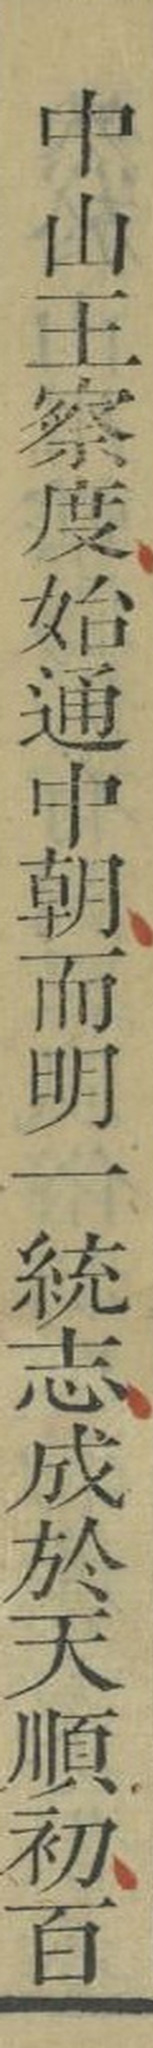中山王察度始通中朝而明一統志成於天順初百
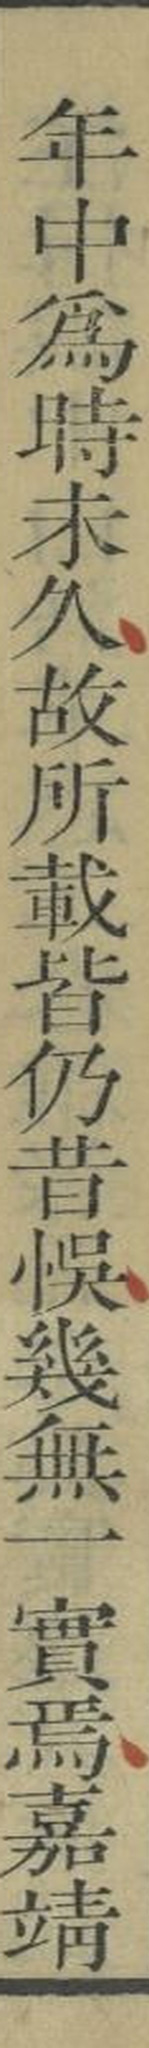年中爲時未久故所載皆仍昔悞幾無一實焉嘉靖
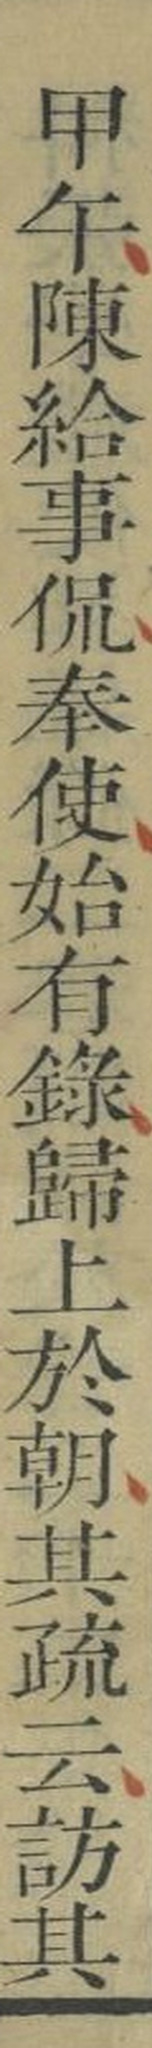甲午陳給事侃奉使始有錄歸上於朝其疏云訪其
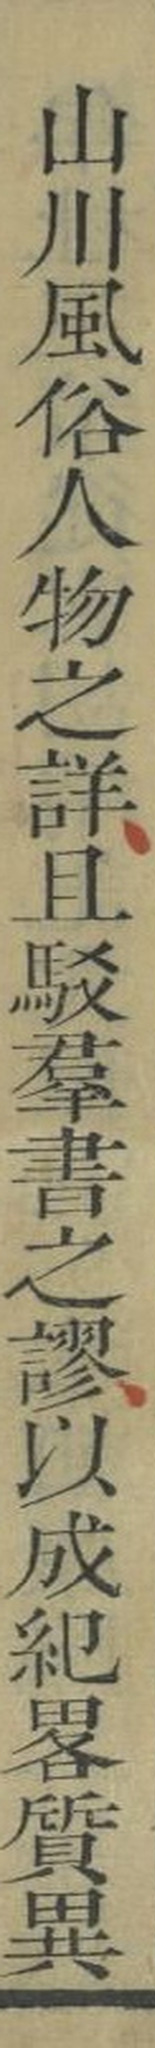山川風俗人物之詳且駁羣書之謬以成紀畧質異
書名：中山伝信録 巻一、巻二
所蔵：University of the Ryukyus Library
